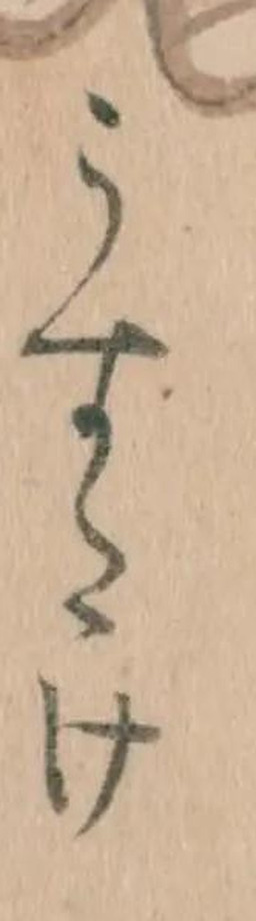うすたけ
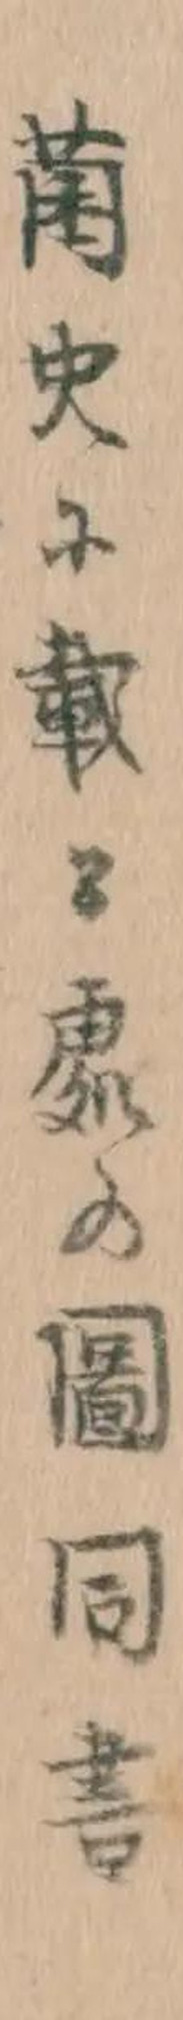菌史に載る処の図同書
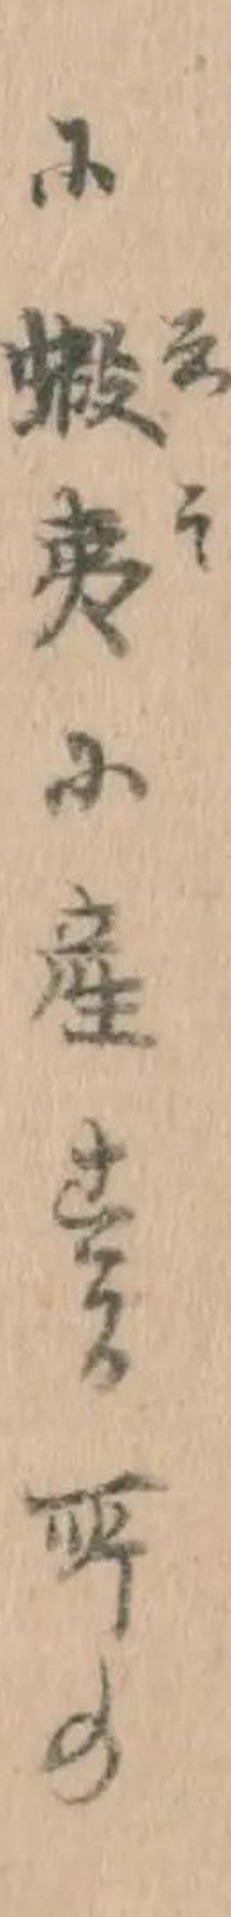に蝦夷に産する所の
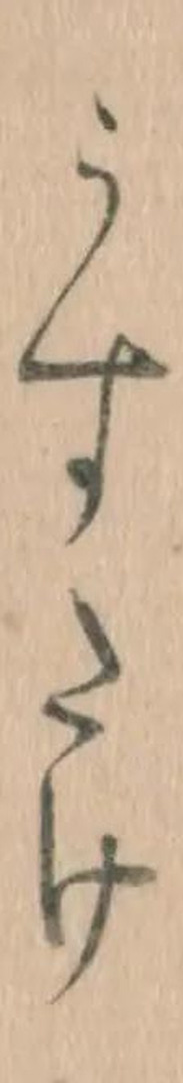うすたけ
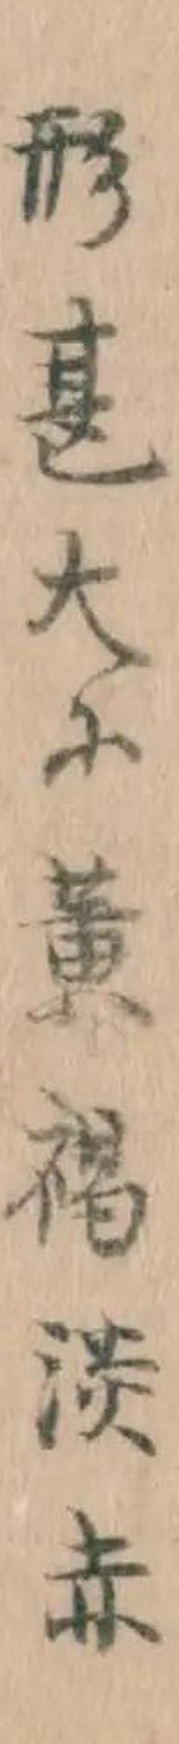形甚大に黄褐淡赤
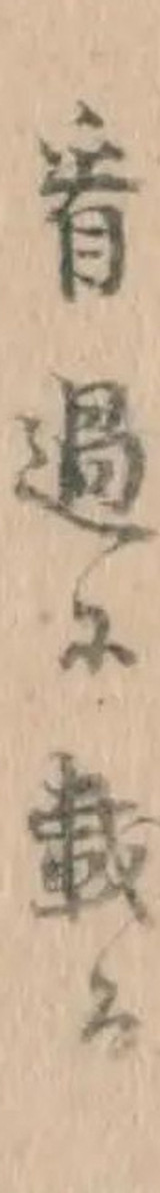看過に載る
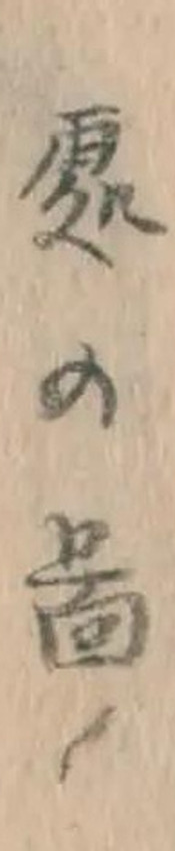処の図
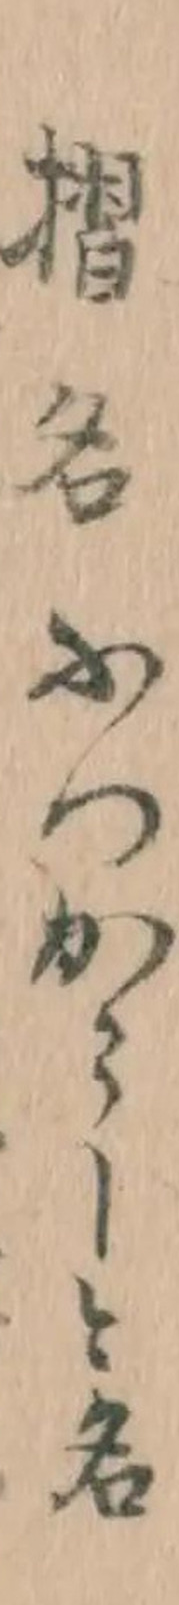摺名ふつかうしと名
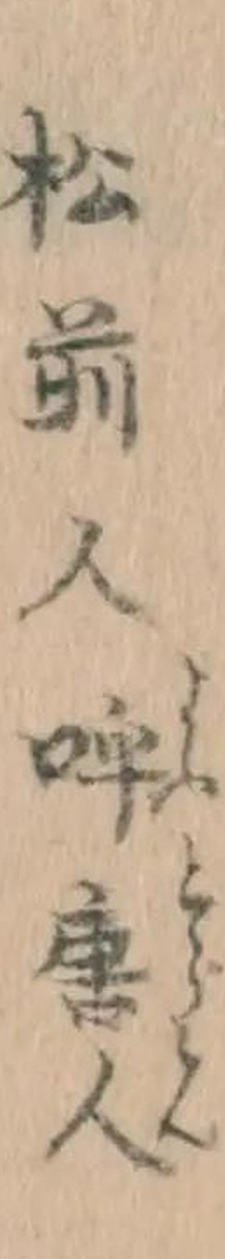松前人呼唐人
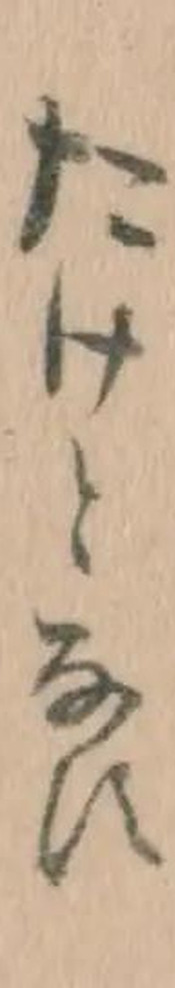たけとなす

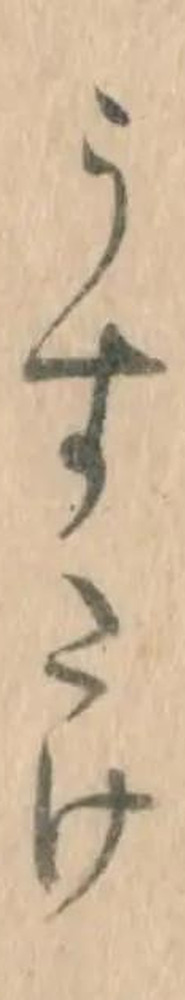うすたけ
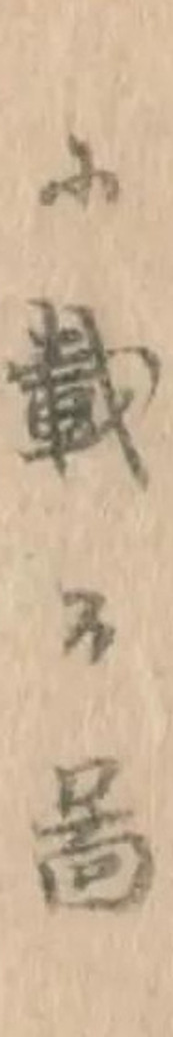に載る図
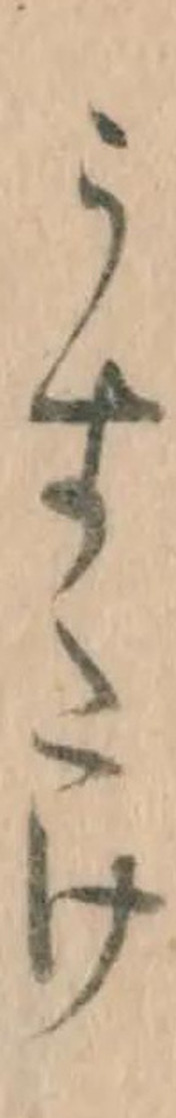うすたけ
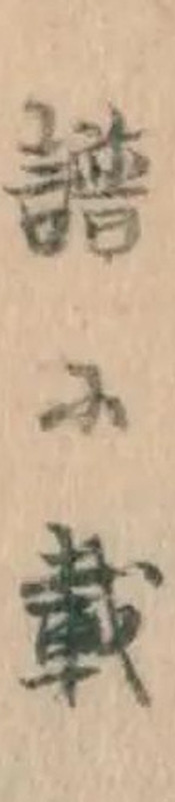譜に載
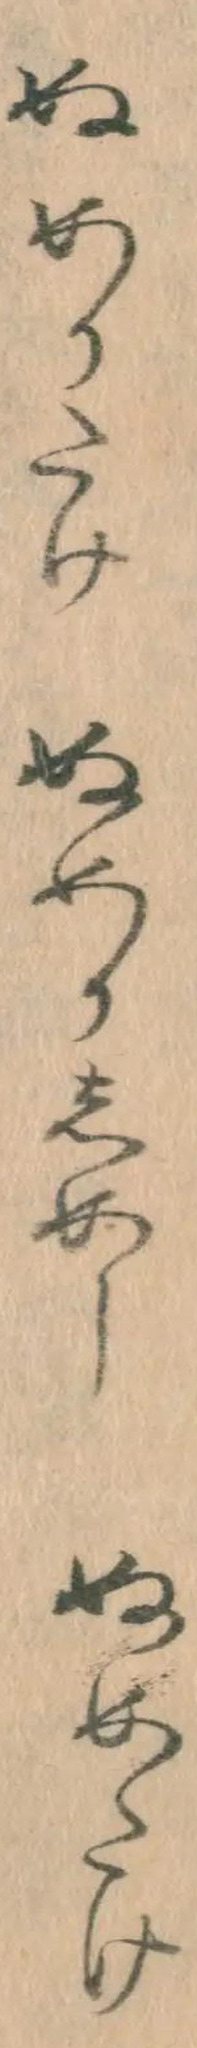ぬめりたけぬめりしめしぬめたけ
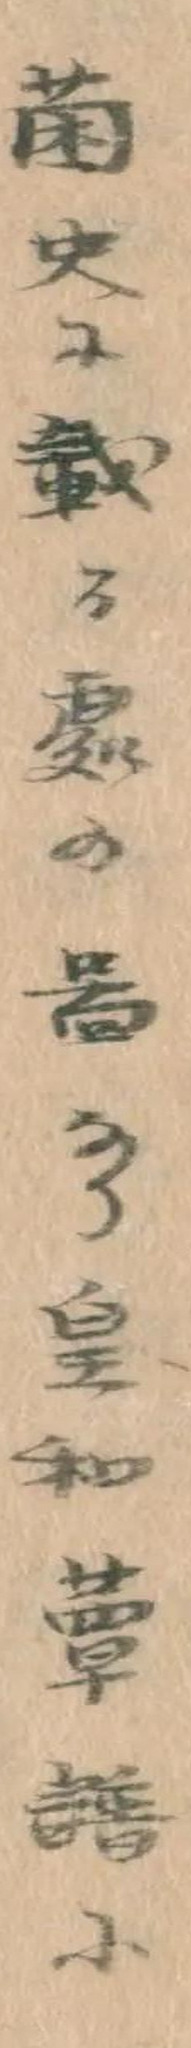菌史に載る処の図なり皇和蕈譜に
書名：本草図譜. 巻55-57
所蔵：国立国会図書館 National Diet Library, JAPAN
